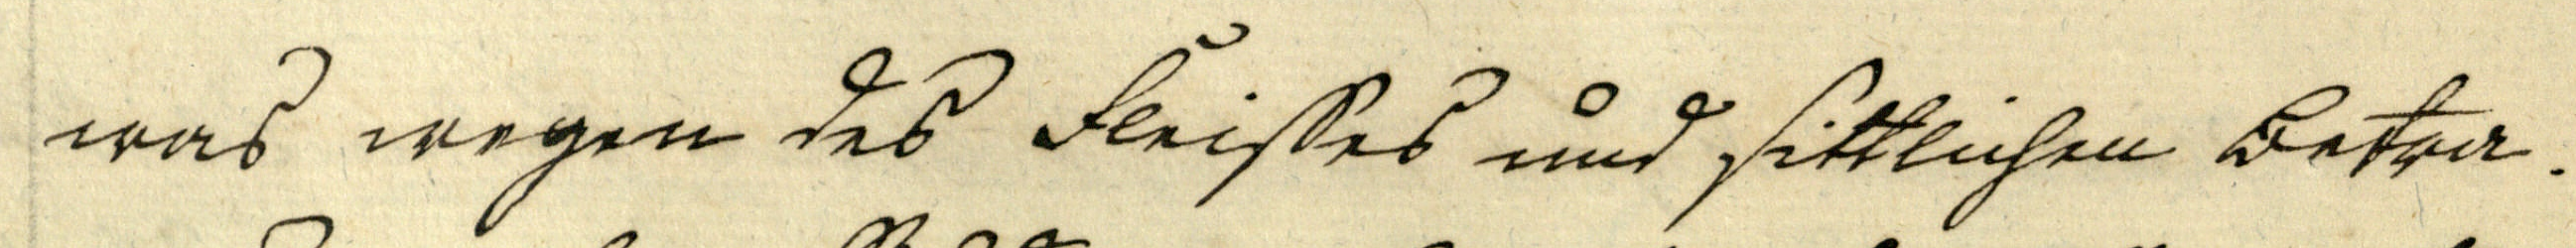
was wegen des Fleisses und sittlichen Betra¬
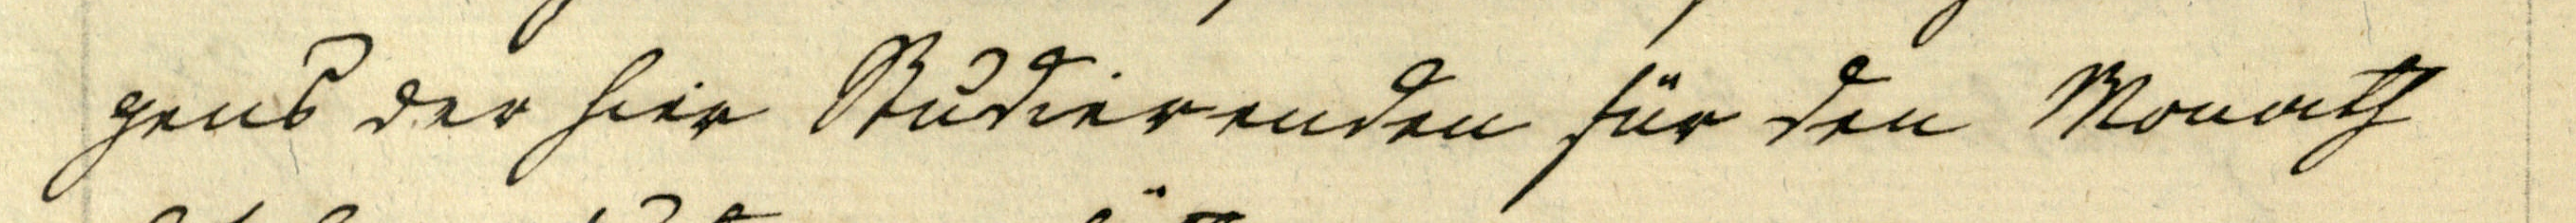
gens der hier Studierenden für den Monath
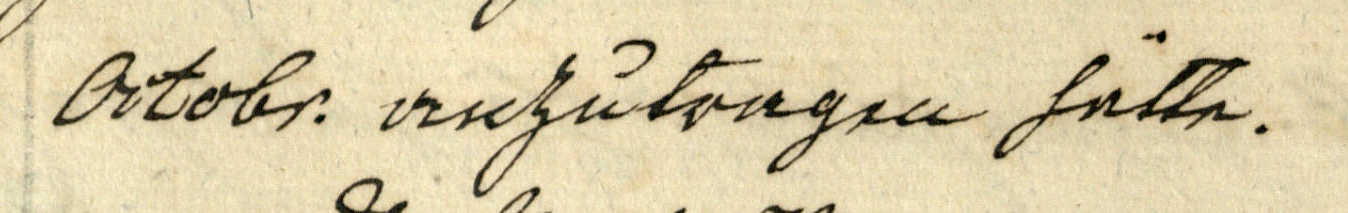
Octobr. anzutragen hätte.
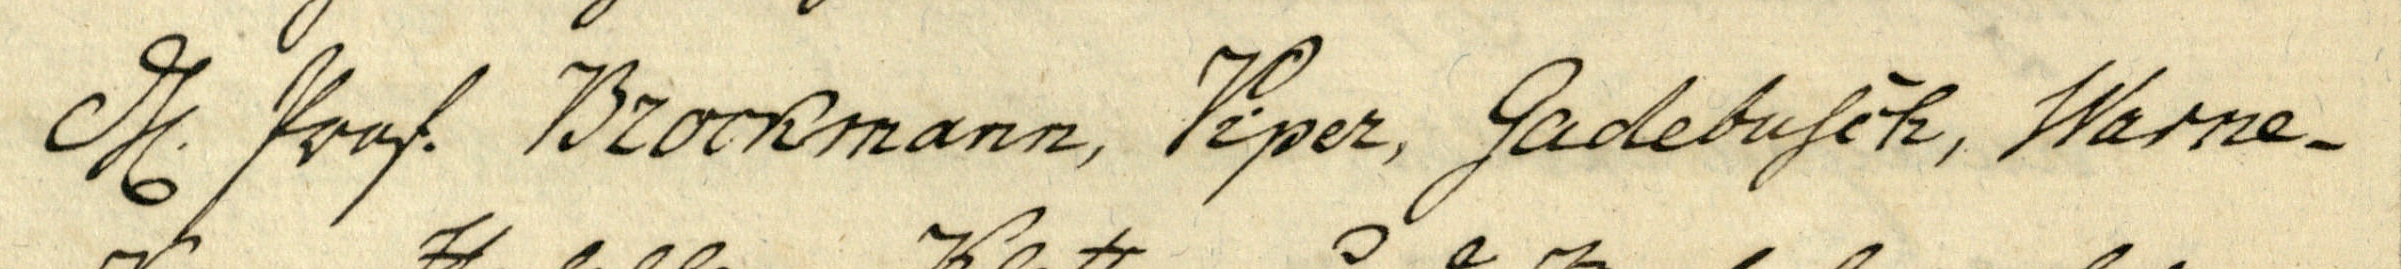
dh. Prof. Brockmann, Piper, Gadebusch, Warne¬
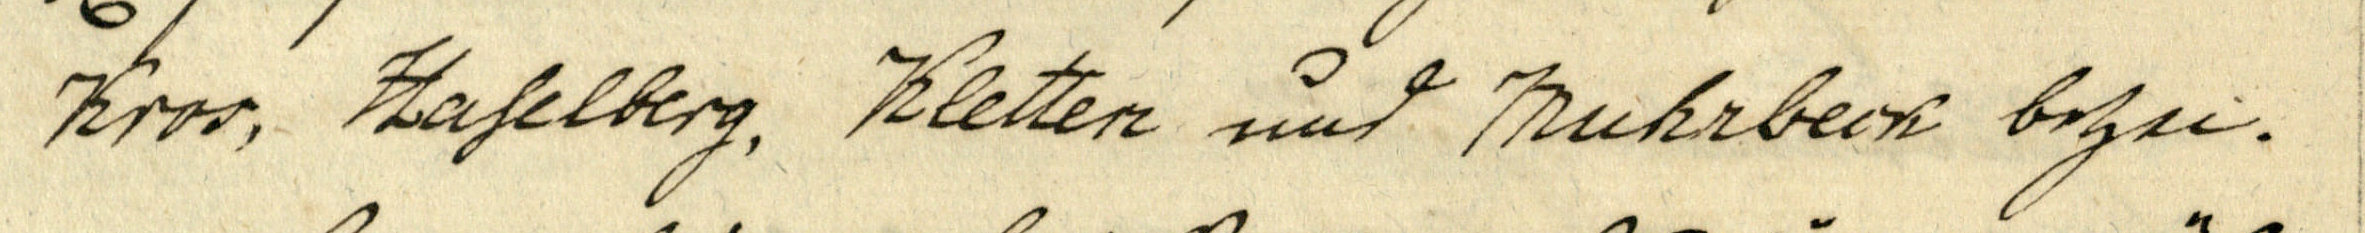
kros, Haselberg, Kletten und Muhrbeck bezei¬
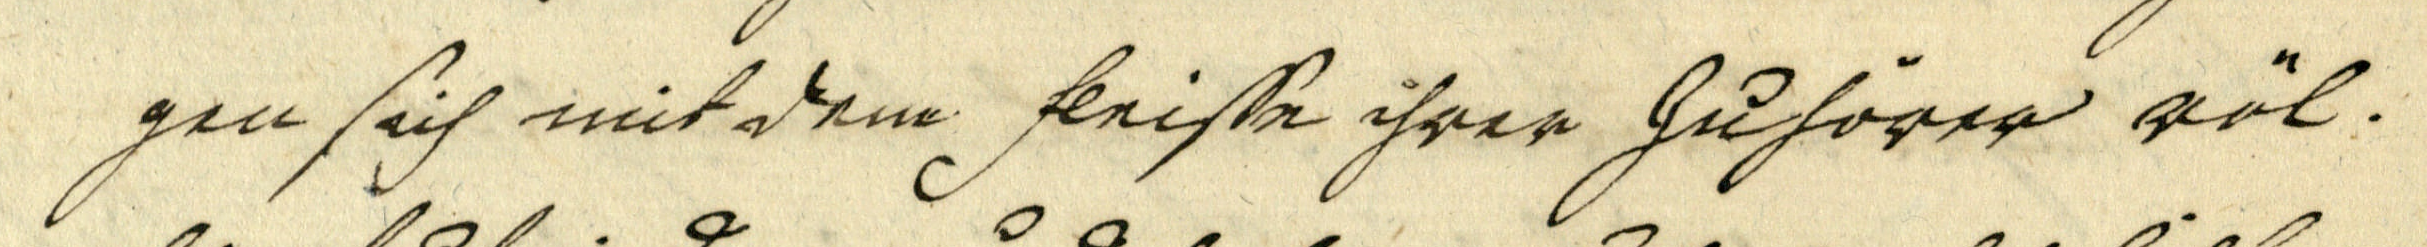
gen sich mit dem Fleisse ihrer Zuhörer völ¬
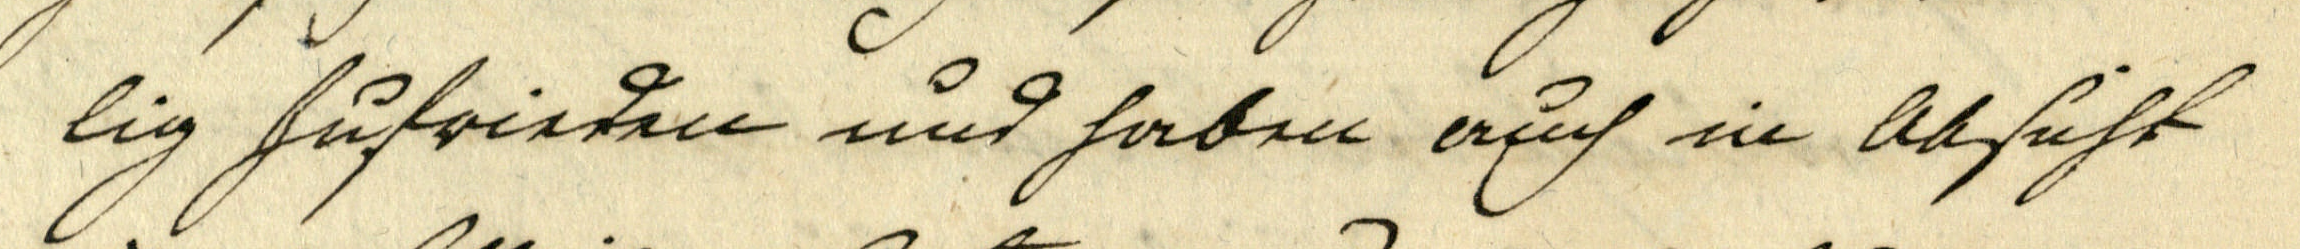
lig zufrieden und haben auch in Absicht
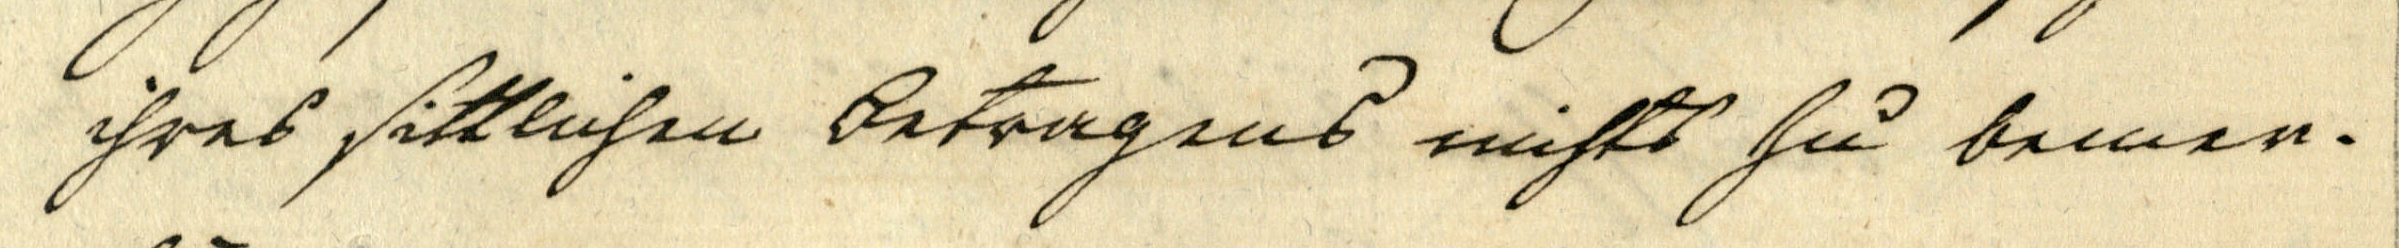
ihres sittlichen Betragens nichts zu bemer-
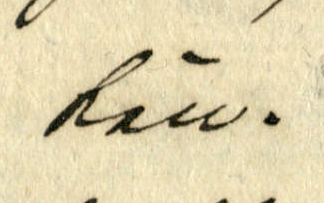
ken.
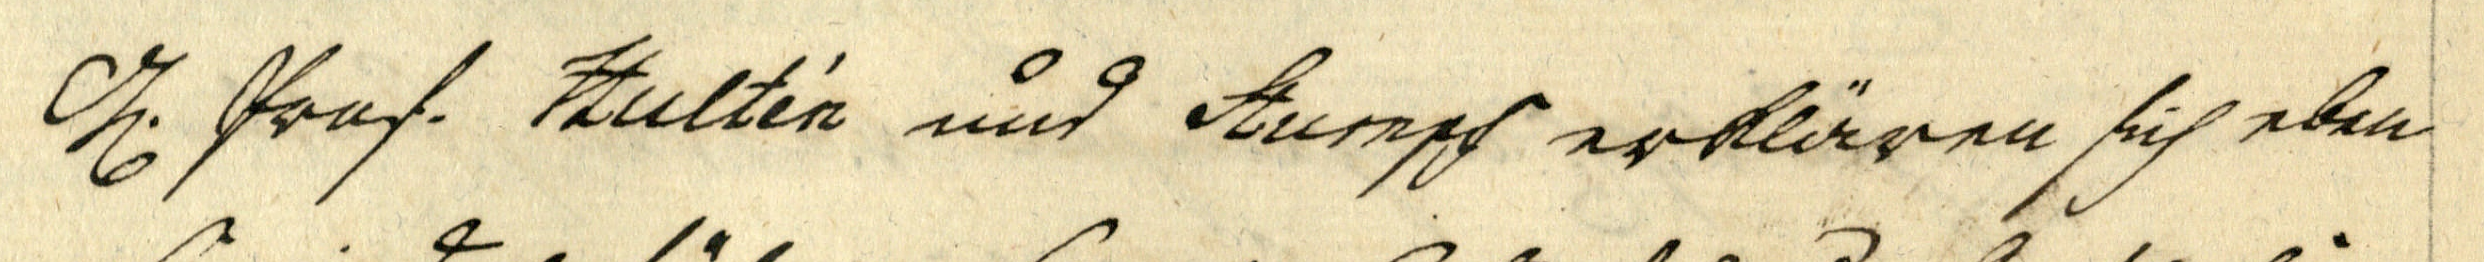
dh. Prof. Hultén und Stumpf erklären sich eben¬
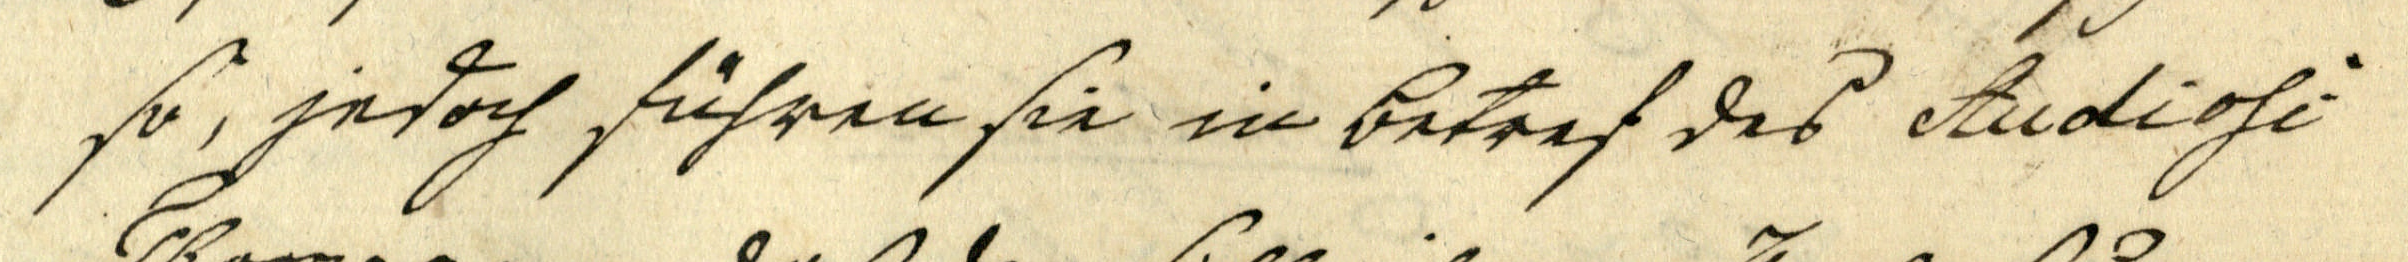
so, jedoch führen sie in Betref des Studiosi
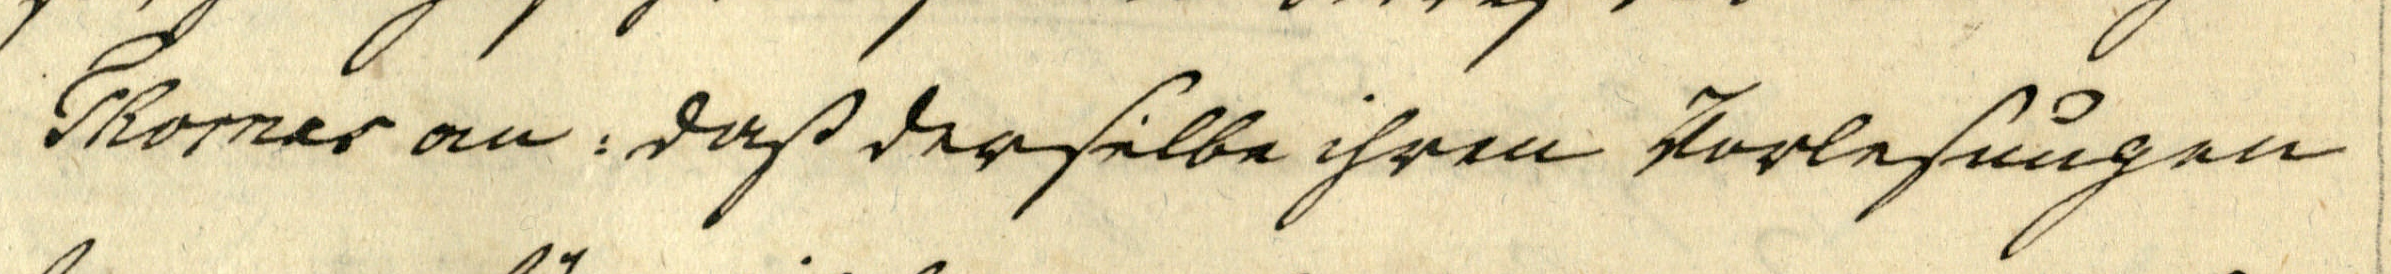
Thomas an, daß derselbe ihren Vorlesungen
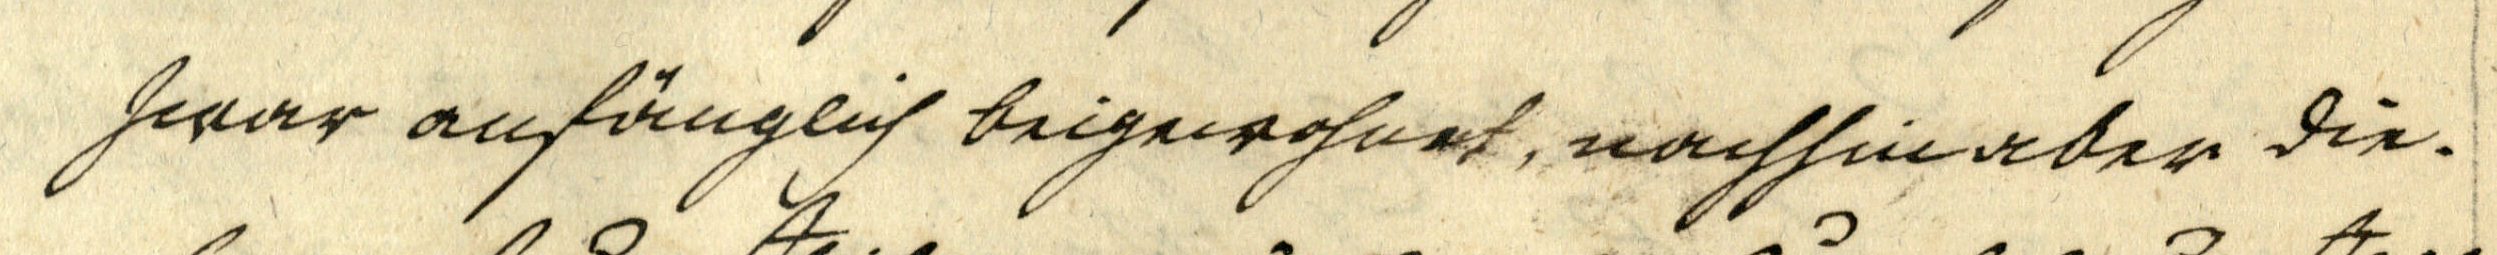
zwar anfänglich beigewohnet, nachhin aber die¬
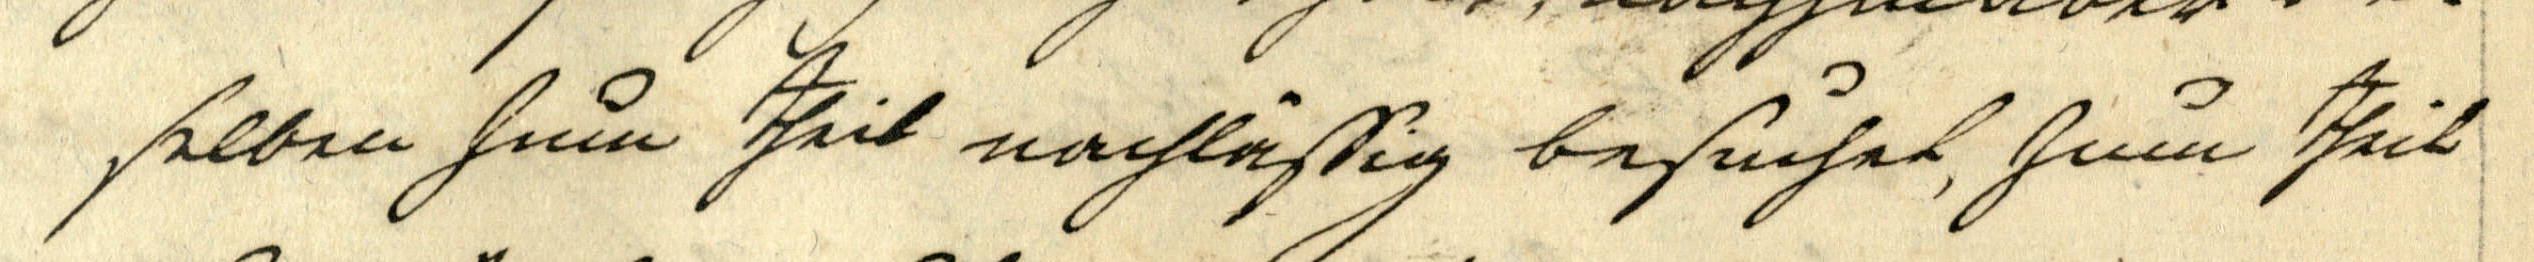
selben zum Theil nachlässig besuchet, zum Theil
